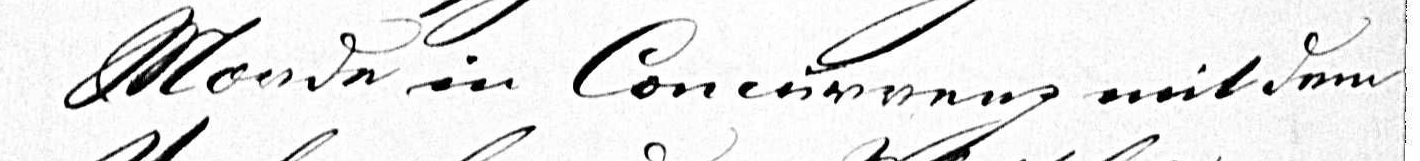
Morde in Concurrenz mit dem
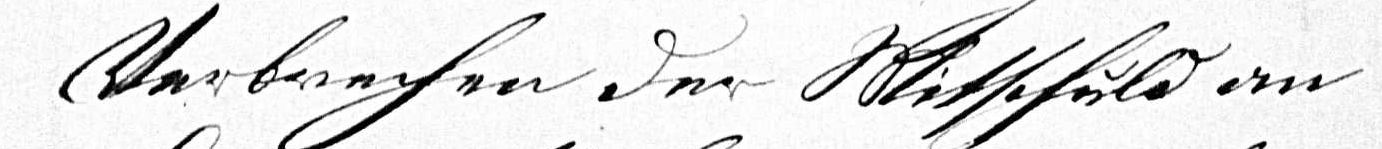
Verbrechen der Mitschuld an
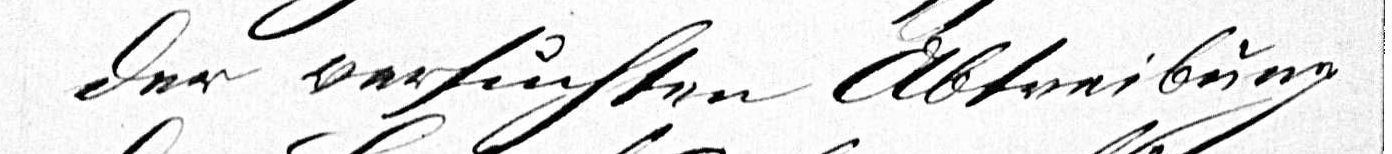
der versuchten Abtreibung
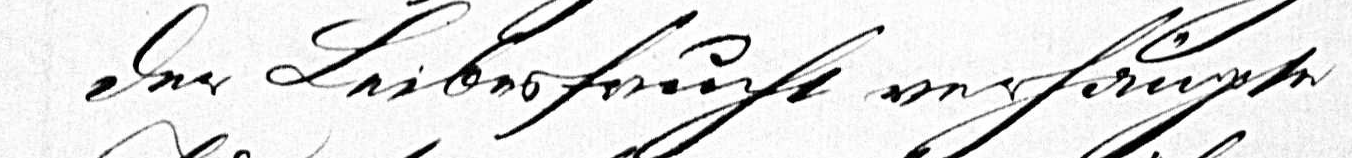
der Leibesfrucht verhängte
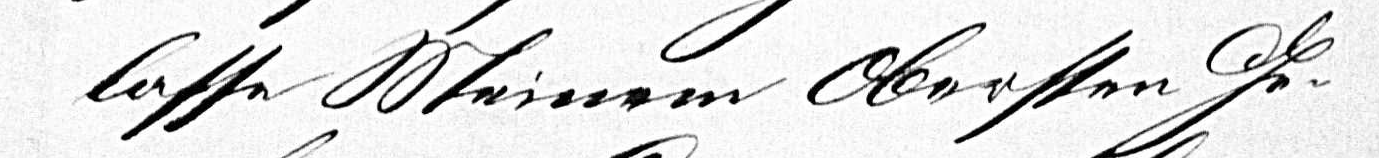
lasse Meinem Obersten Ge¬
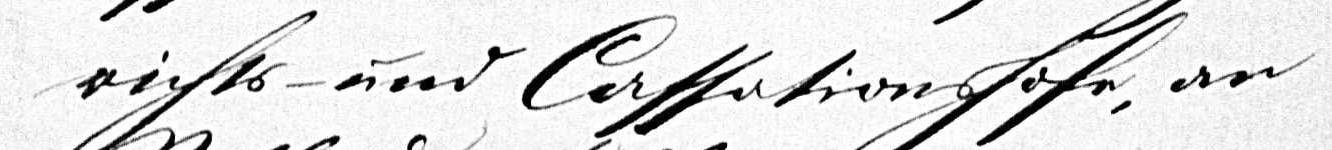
richts- und Cassationshofe, an
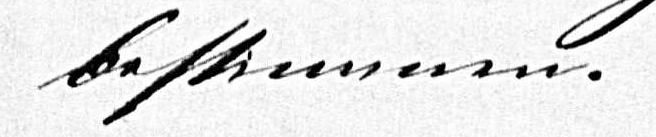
bestimmen.
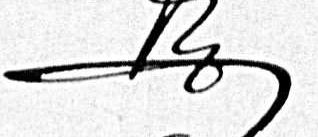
FJ
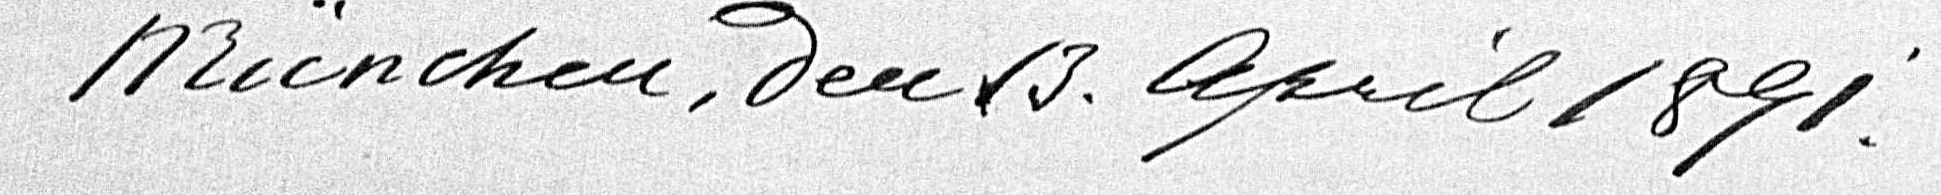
München, den 13. April 1891
